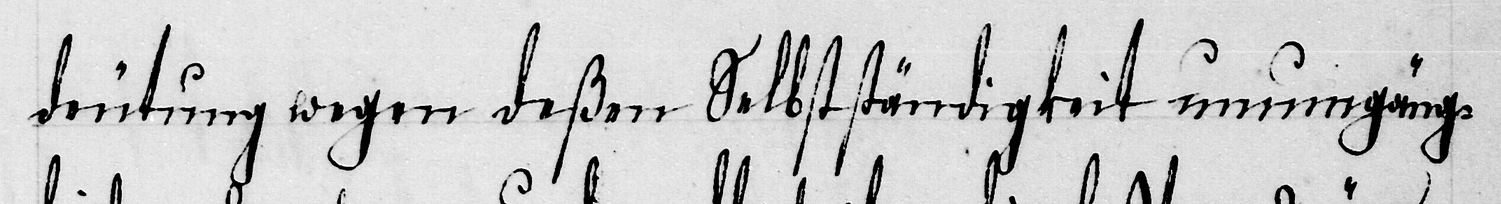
deutung wegen deßen Selbstständigkeit unumgäng¬
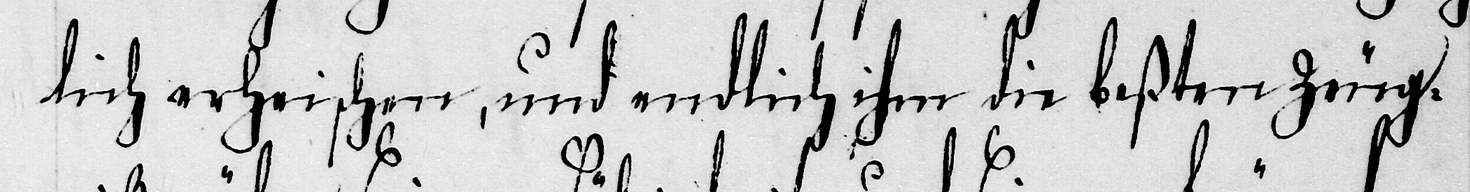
lich erheischen, und endlich ihm die beßten Zeug¬
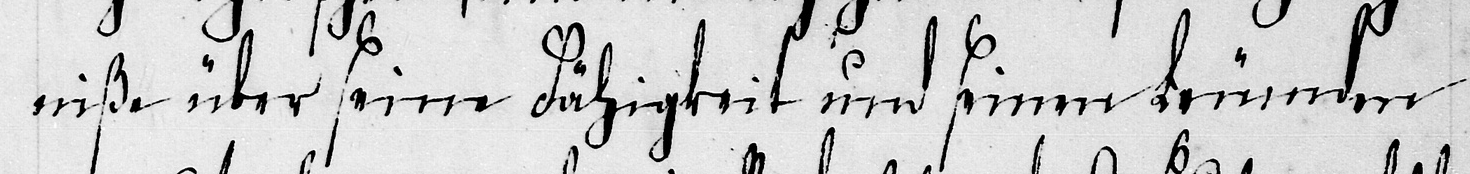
niße über seine Fähigkeit und seinen Leumden
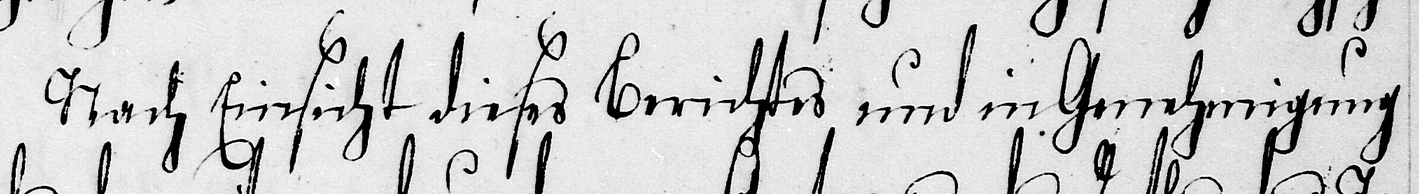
Nach Einsicht dieses Berichtes und in Genehmigung
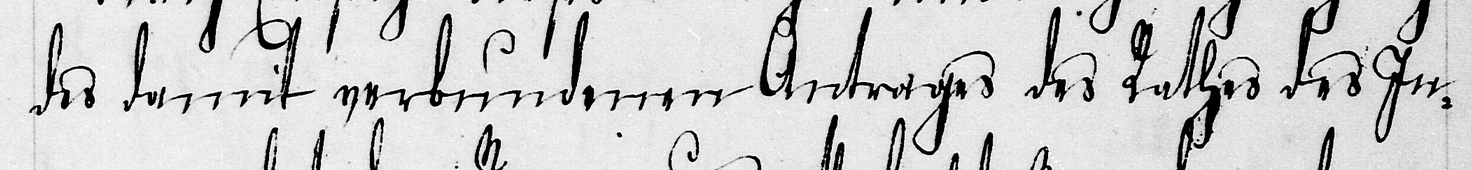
des damit verbundenen Antrages des Rathes des In¬
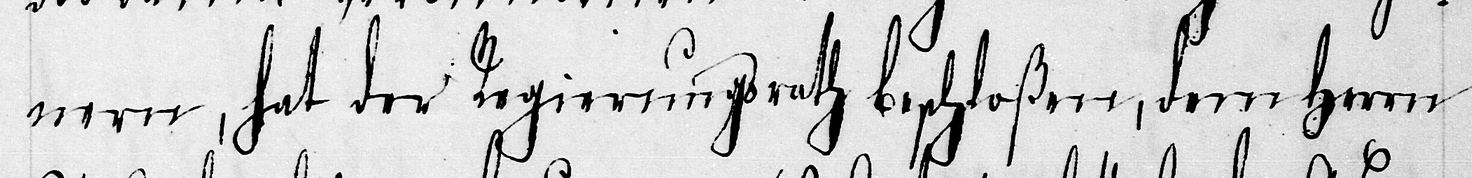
nern, hat der Regierungsrath beschloßen, dem Herrn
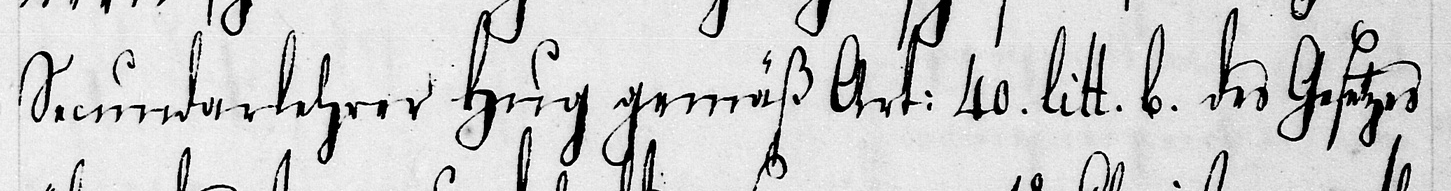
Secundarlehrer Hug gemäß Art: 40. litt. b. des Gesetzes
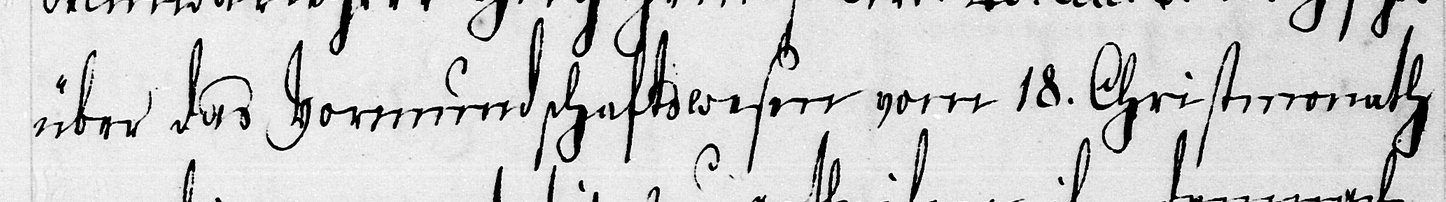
über das Vormundschaftswesen vom 18. Christmonath
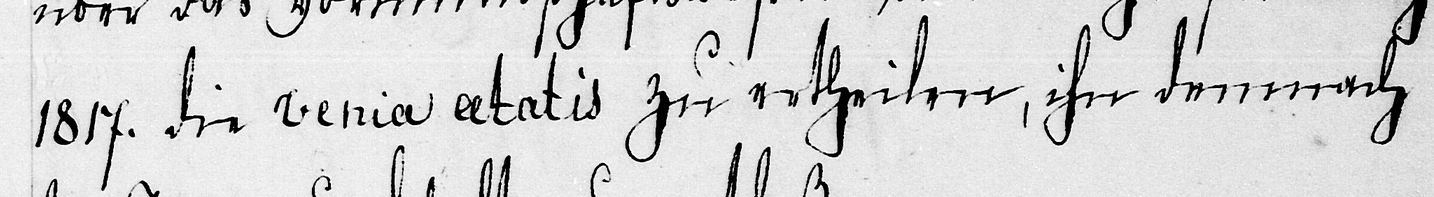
1817. die venia aetatis zu ertheilen, ihn demnach
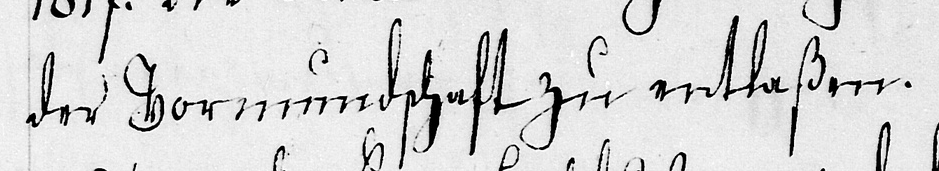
der Vormundschaft zu entlaßen.
